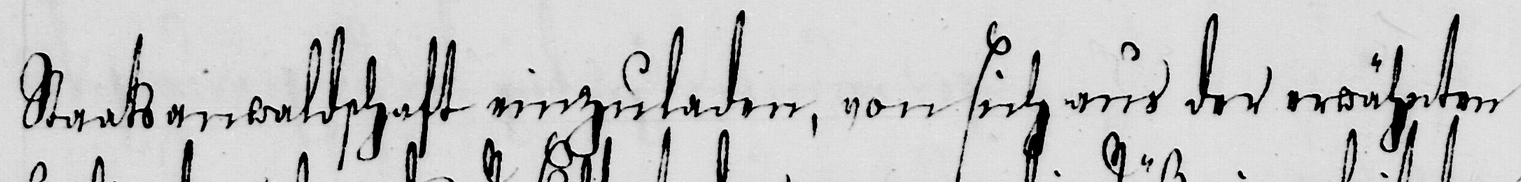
Staatsanwaldschaft einzuladen, von sich aus der erwähnten
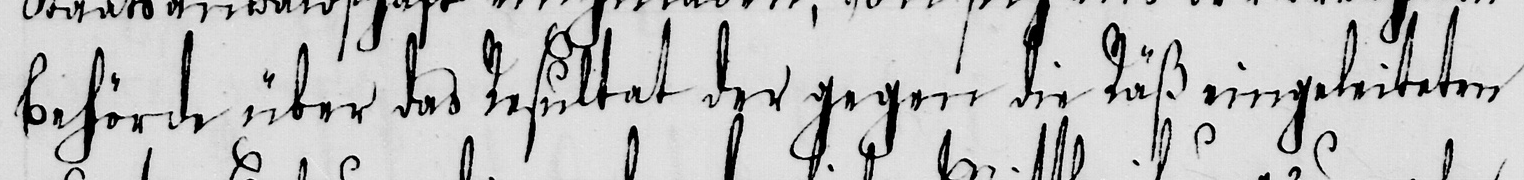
Behörde über das Resultat der gegen die Räß eingeleiteten
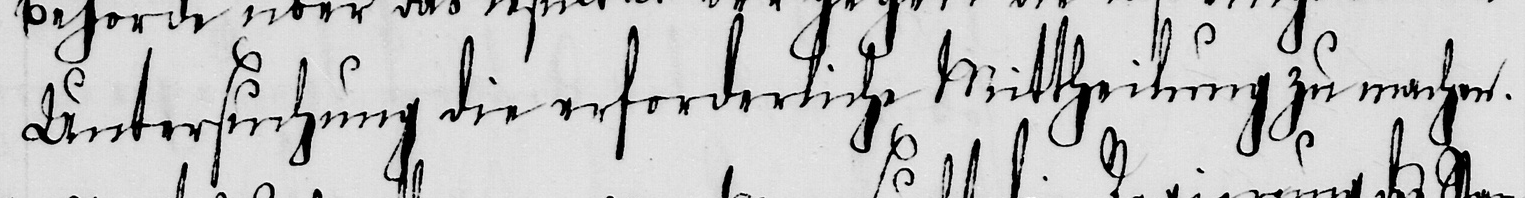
Untersuchung die erforderliche Mittheilung zu machen.
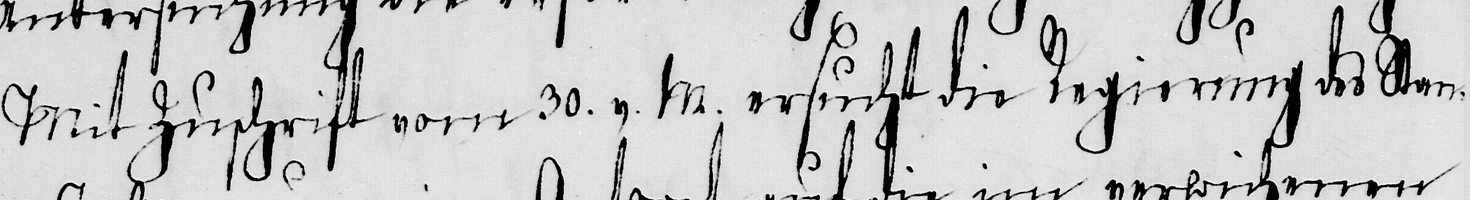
Mit Zuschrift vom 30. v. M. ersucht die Regierung des Stan¬
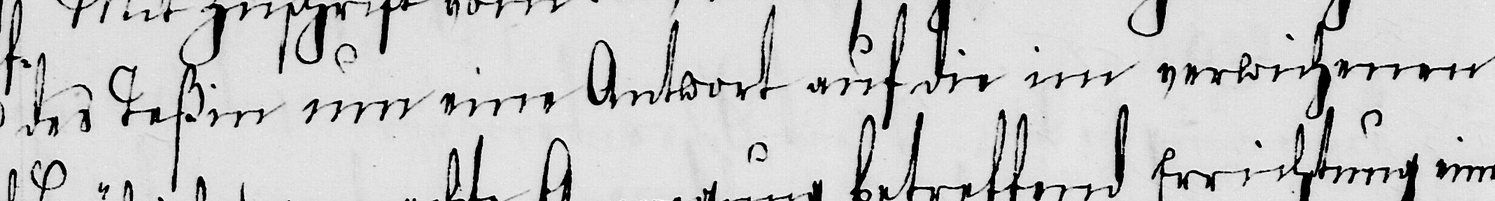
des Teßin um eine Antwort auf die im verwichenen
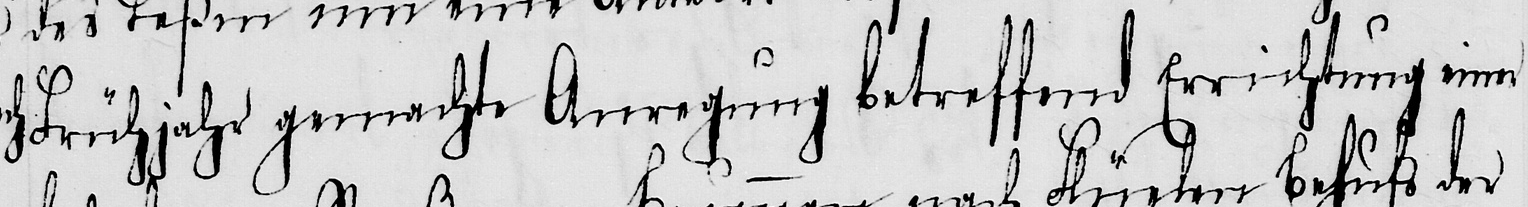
Frühjahr gemachte Anregung betreffend Errichtung ein¬
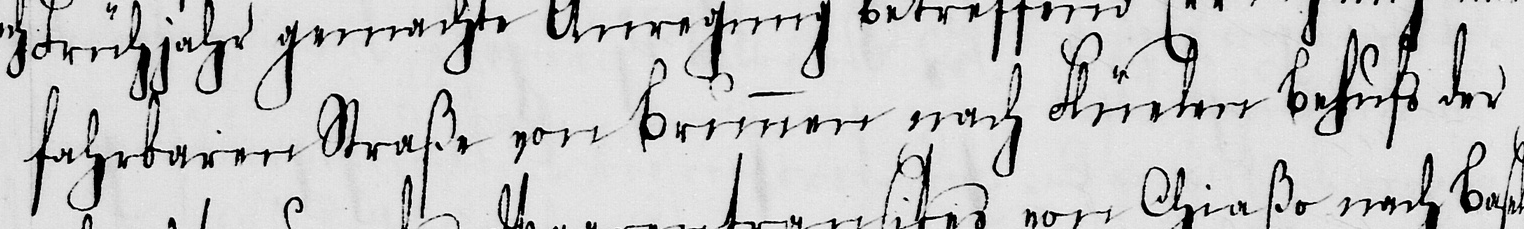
fahrbaren Straße von Brunnen nach Flüelen Behufs der
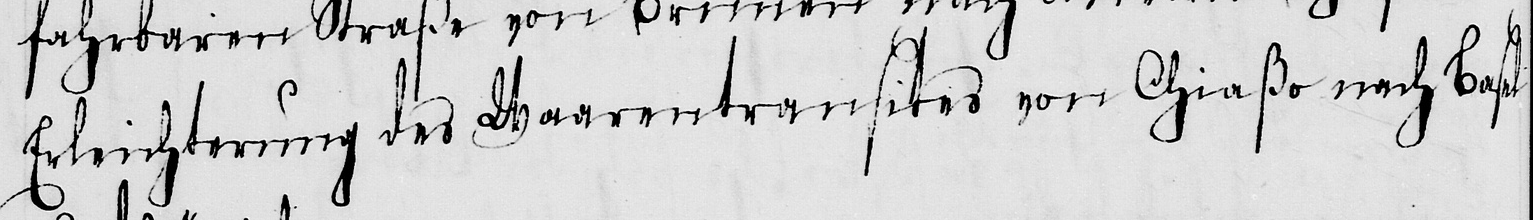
Erleichterung des Waarentransites von Chiaßo nach Basel
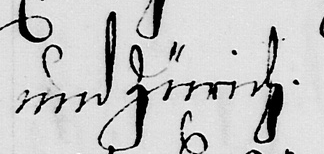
und Zürich.
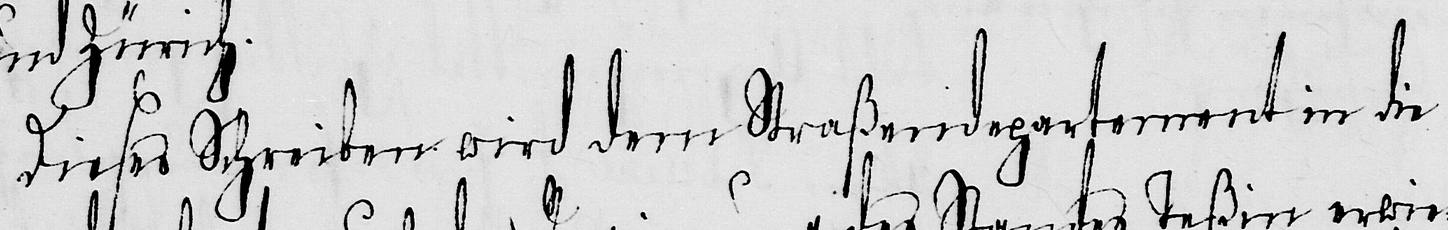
Dieses Schreiben wird dem Straßendepartement in die
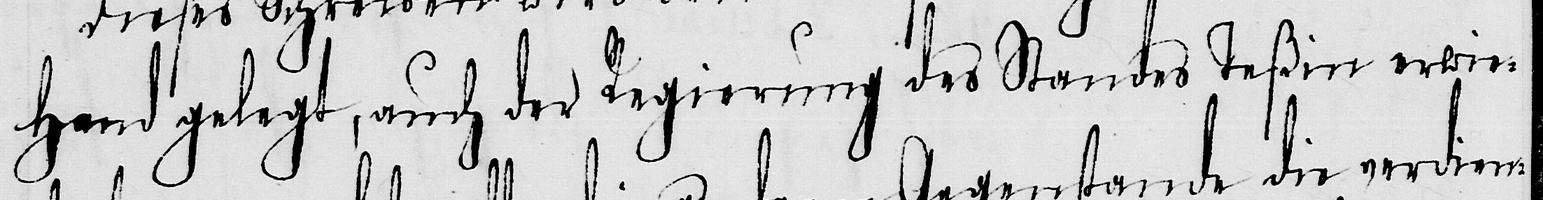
Hand gelegt, auch der Regierung des Standes Teßin erwie¬
